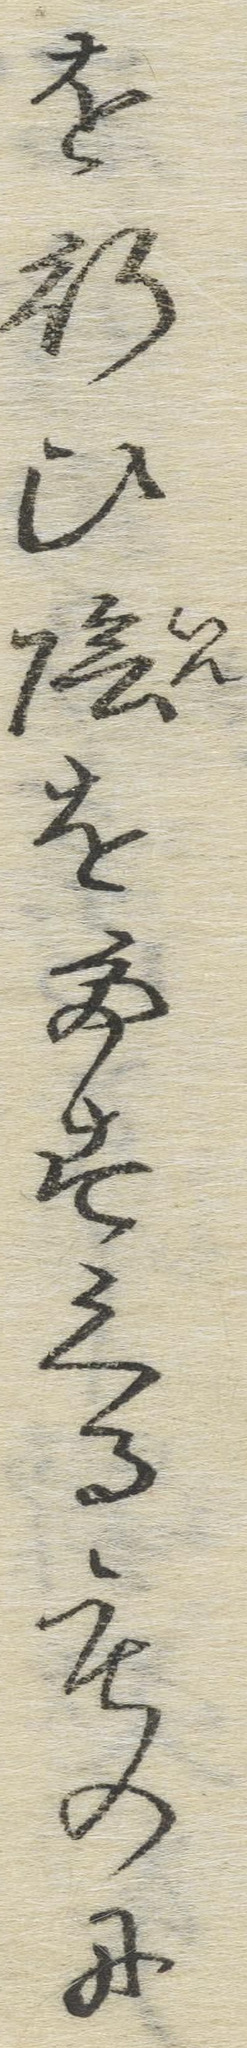を行ひ陰をたすくるものに
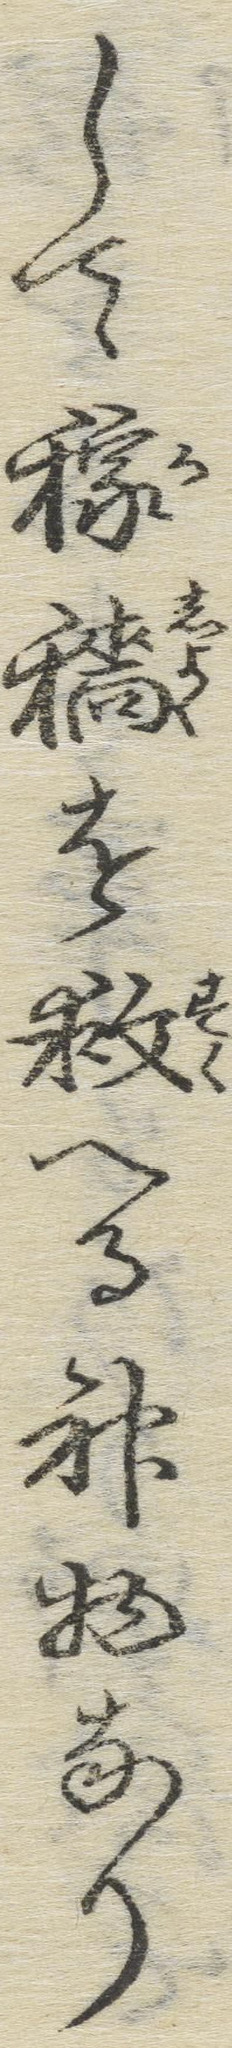して稼穡を救へる神物なり
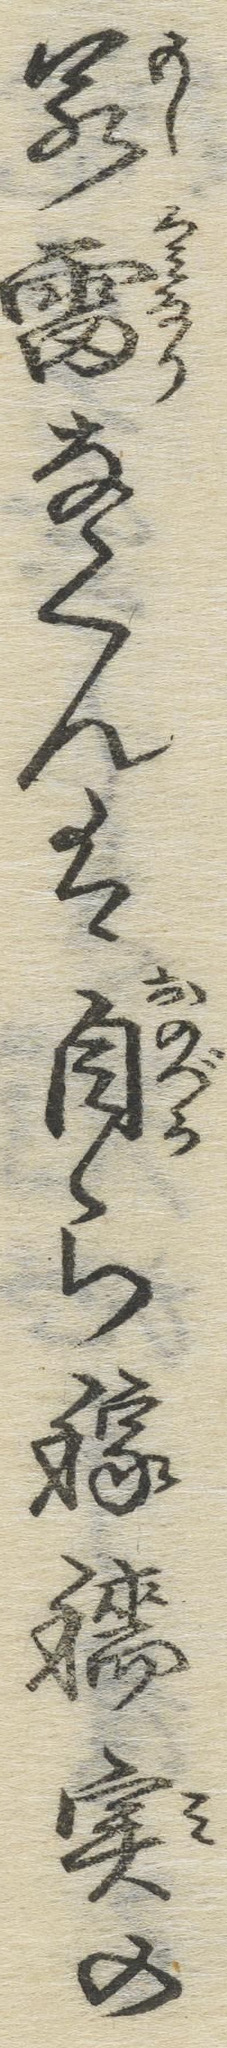若雷なくんは自ら稼穡実の
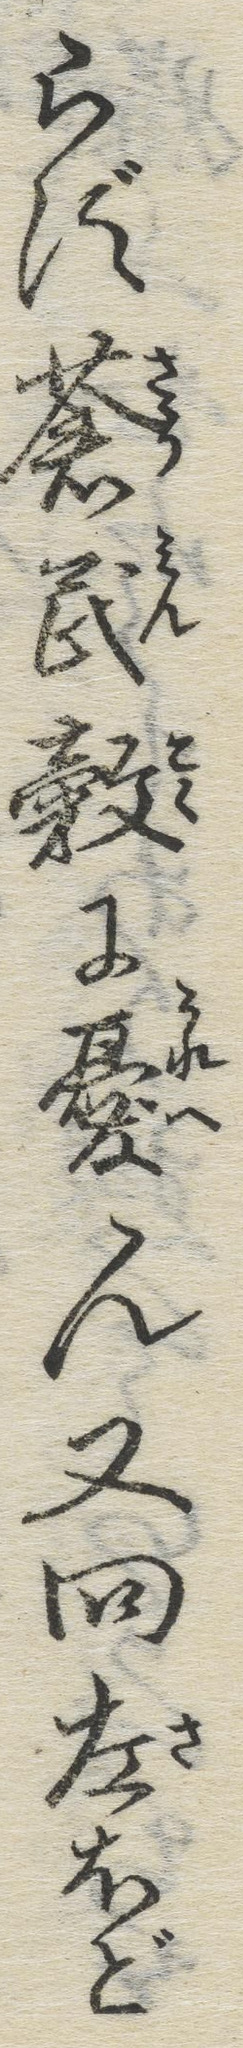らず蒼民穀に憂ん又問左ほど
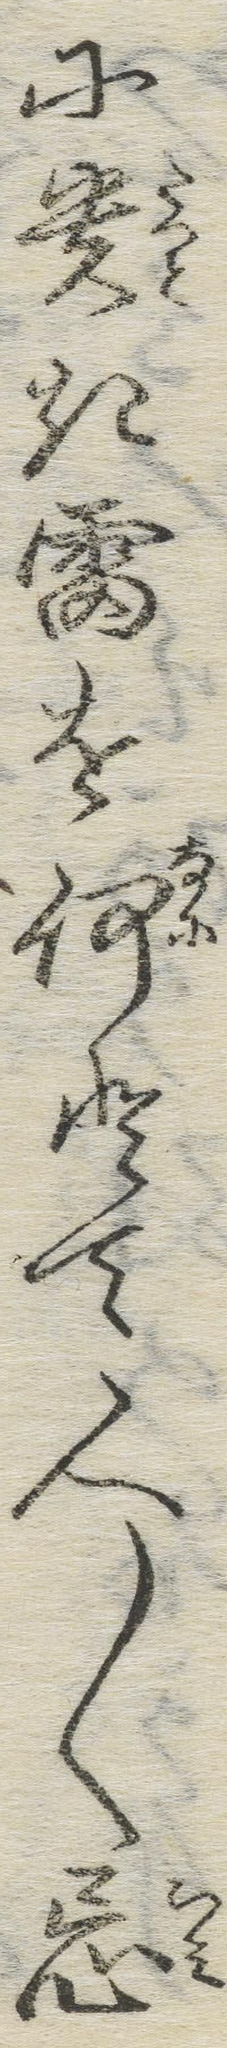に貴き雷を何とて人〱忌
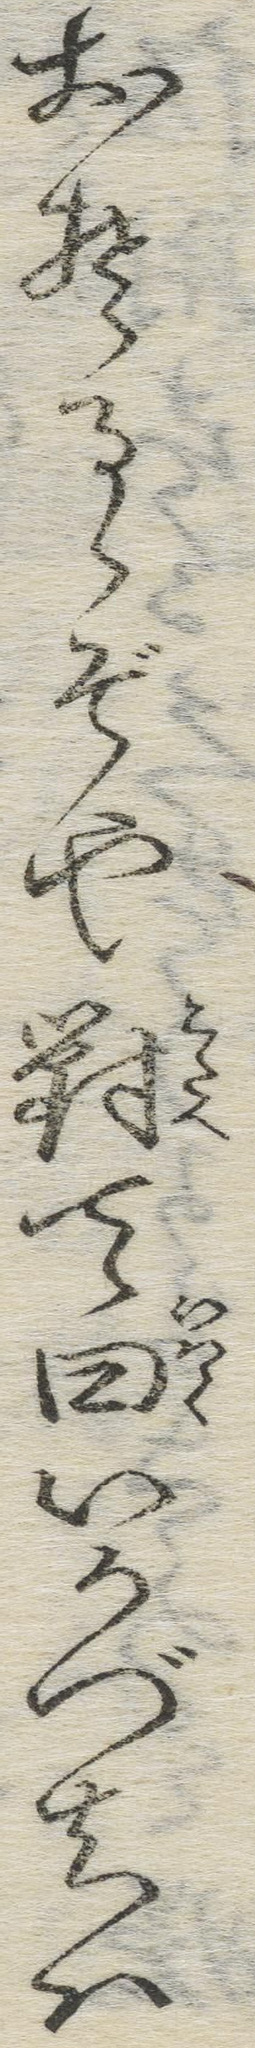おそるゝぞや對て曰いかづちは
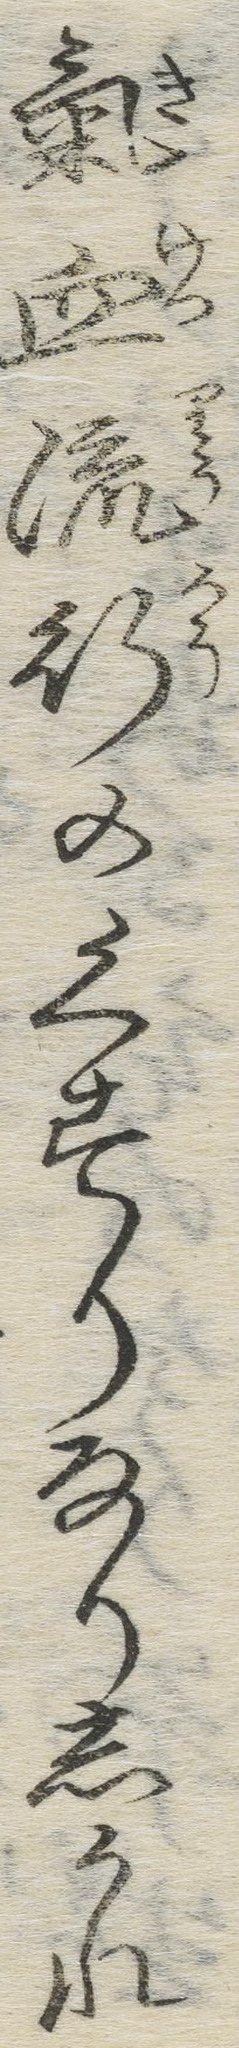気血流行のくすりなりしかれ
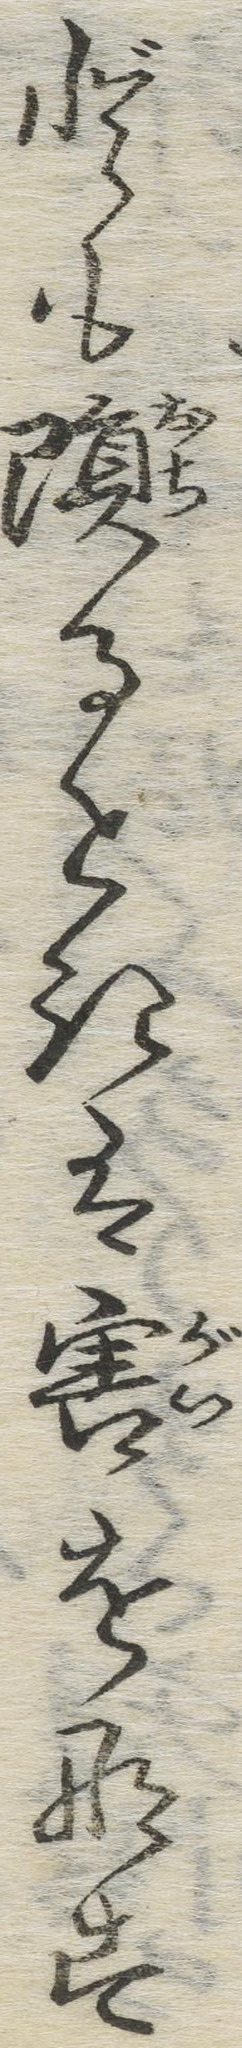ども隕るときは害をなす
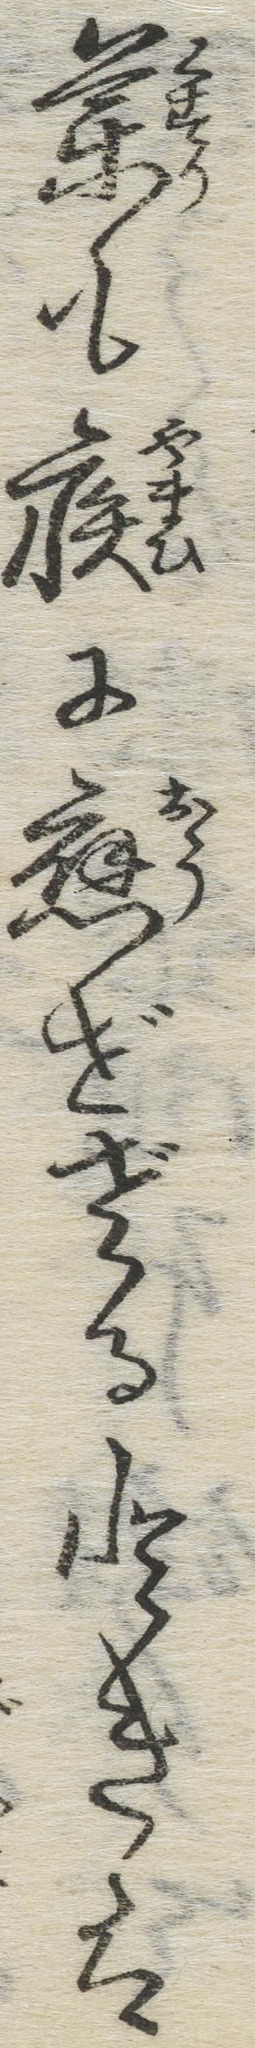薬も疾に応ぜざるときは
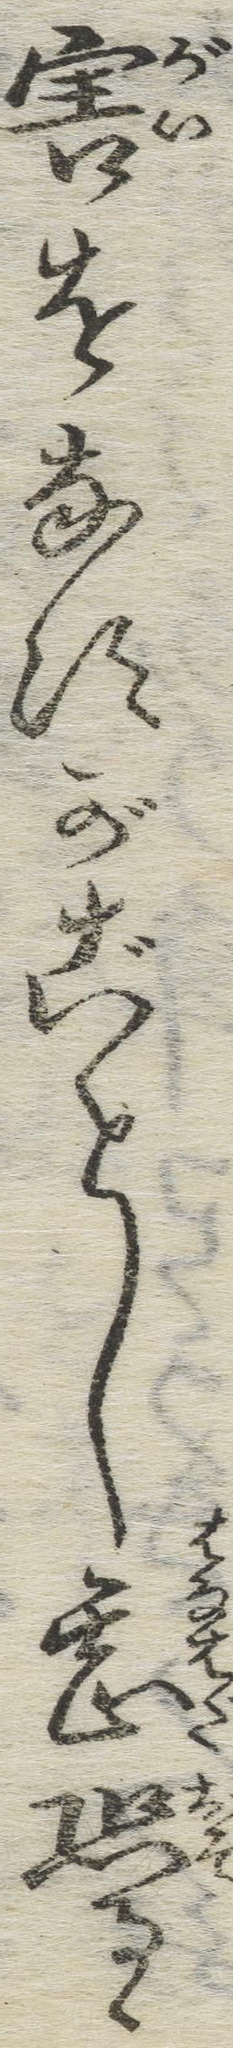害をなすがごとし甚恐るゝ
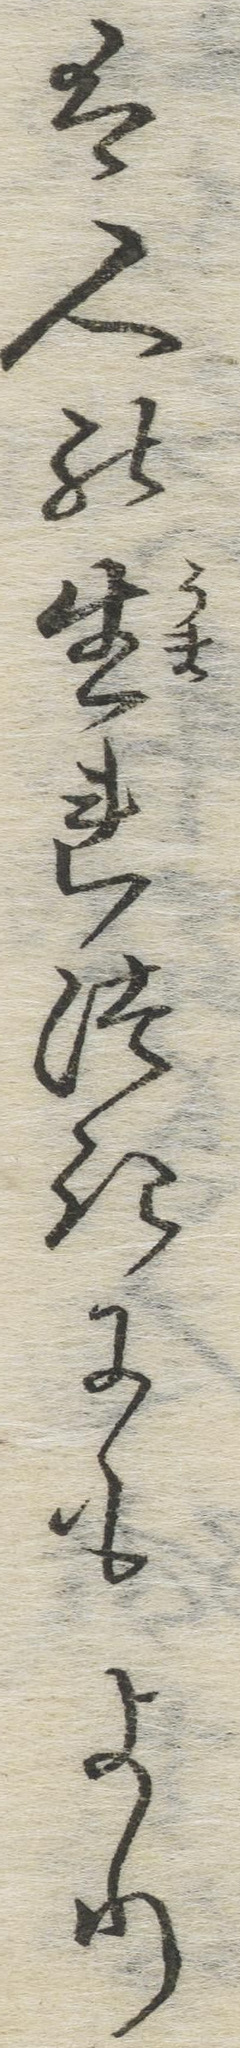は人の生れつきにもより

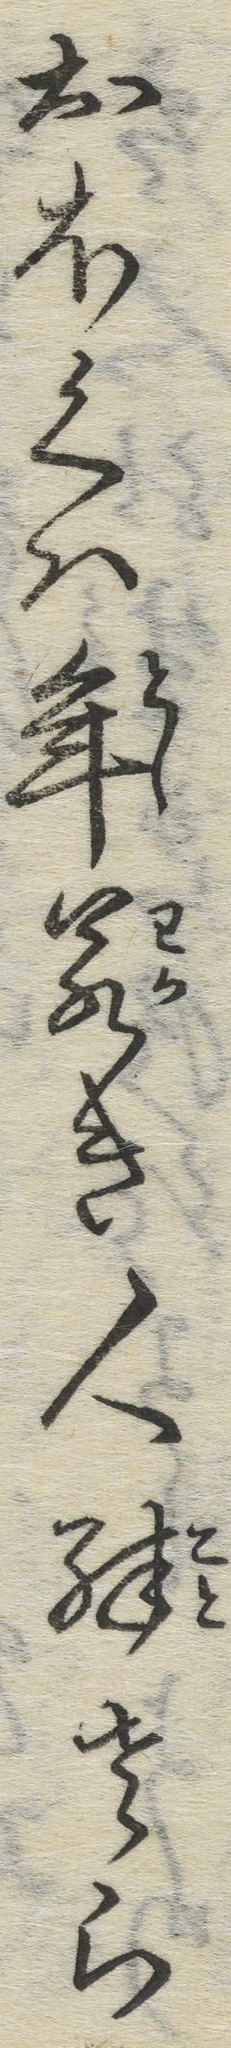おほくは年若き人殊さら
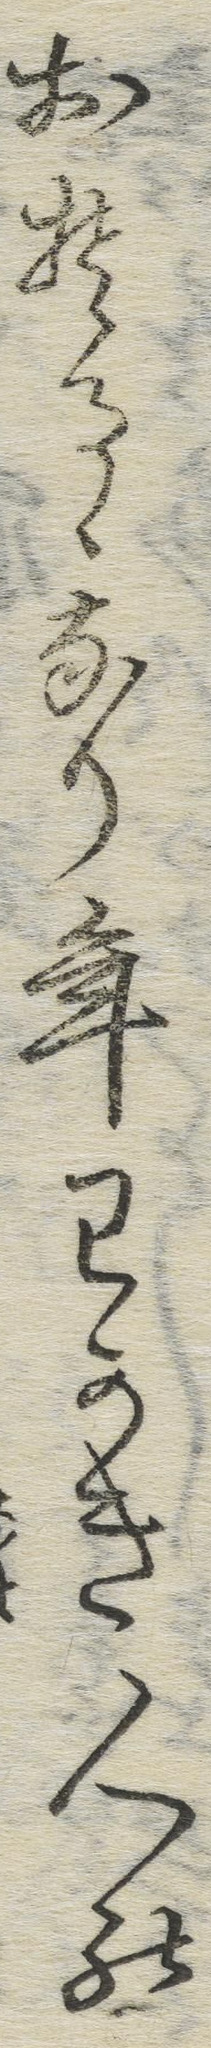おそるゝなり年わかき人の
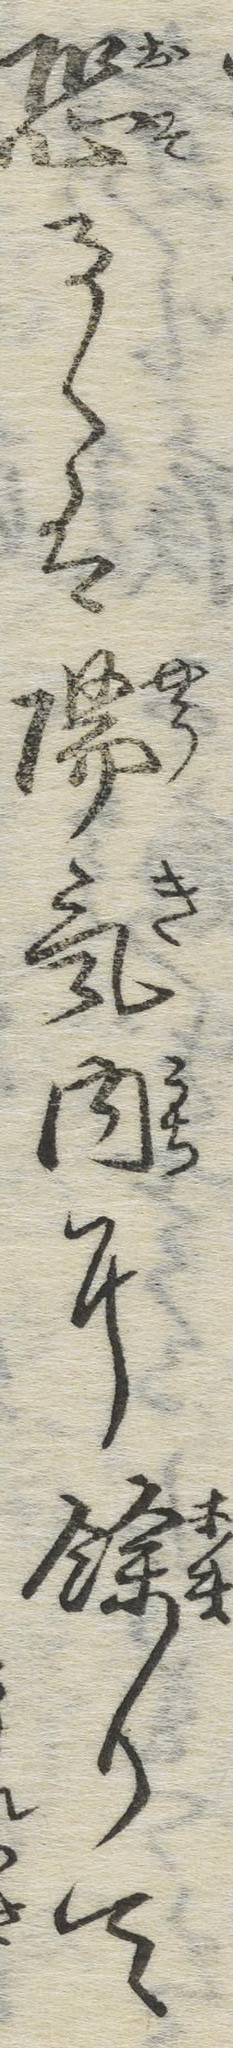恐るゝは陽気内に餘りて
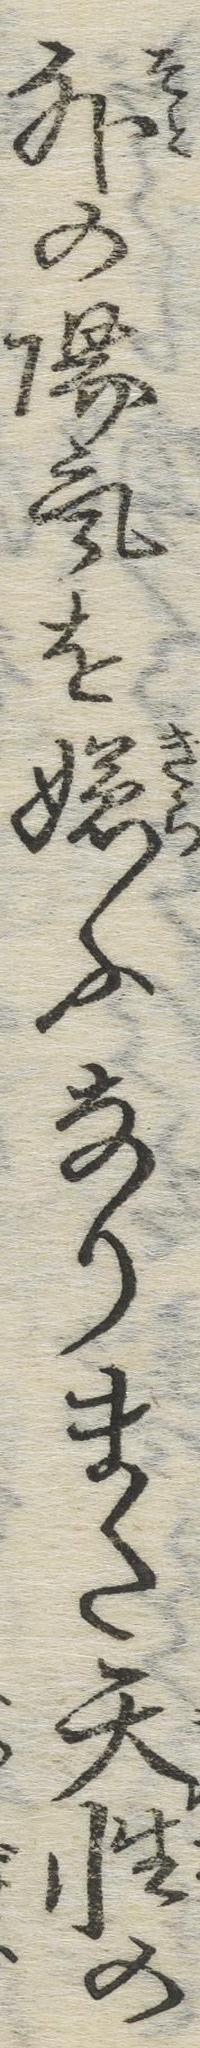外の陽気を嫌ふなりまた天性の
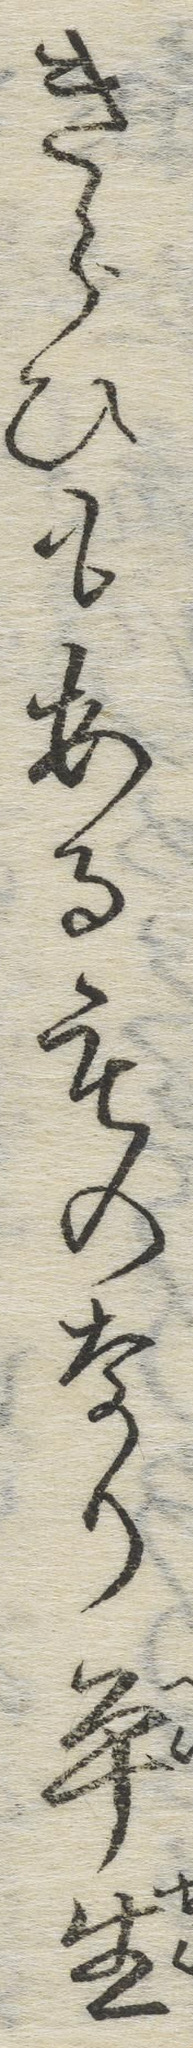きらひもあるものなり平生
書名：雷公地震由來記　全
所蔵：東京大学地震研究所図書室 Earthquake Research Institute Library, The University of Tokyo, JAPAN
